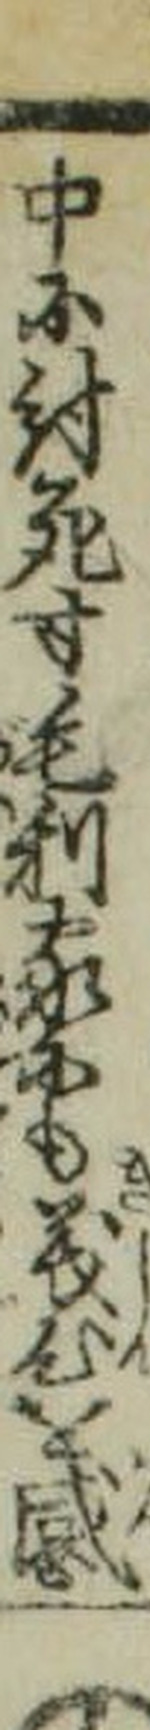中に討死す毛利家にも義心を感
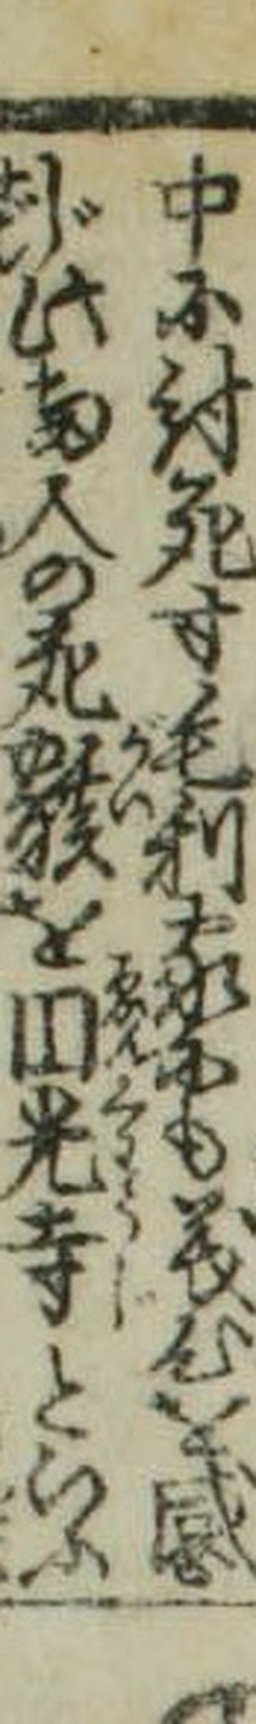じ此両人の死骸を円光寺といふ
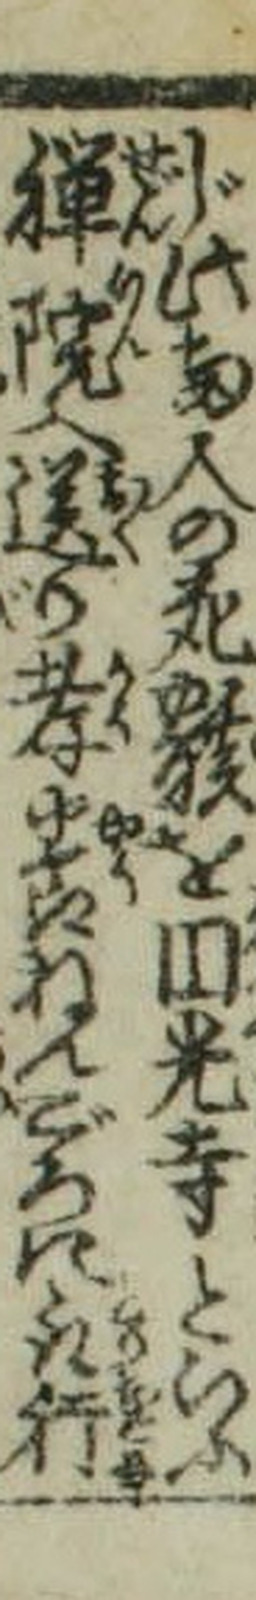禅院へ送り孝養ねんごろに取行
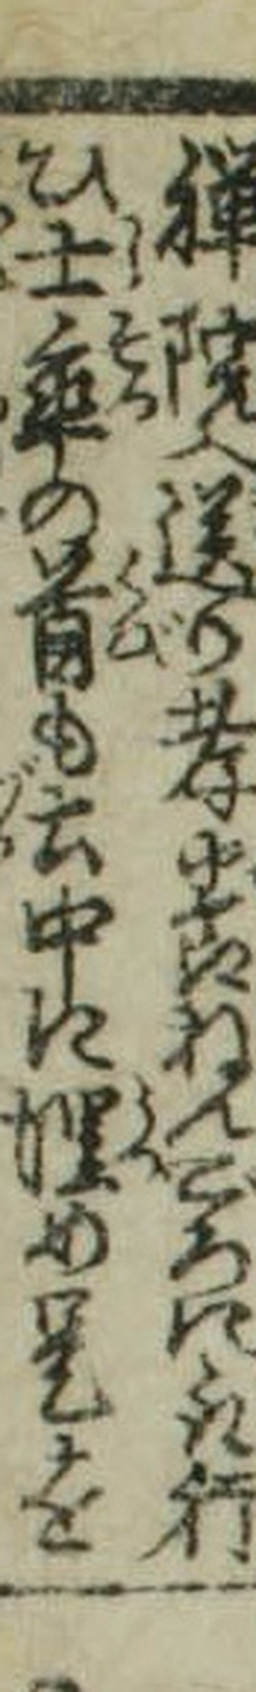ひ士卒の首も土中に埋め是を
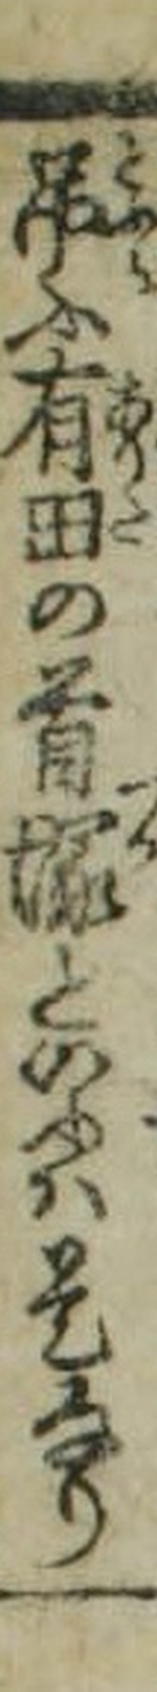弔ふ有田の首塚といふは是なり
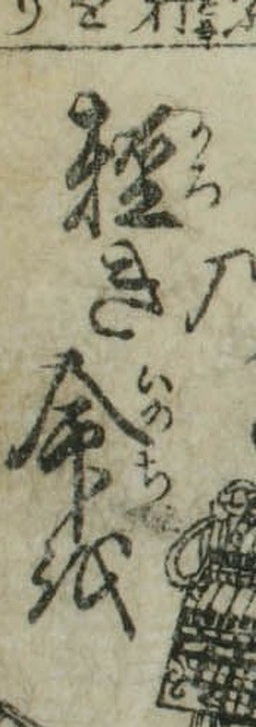軽き命を

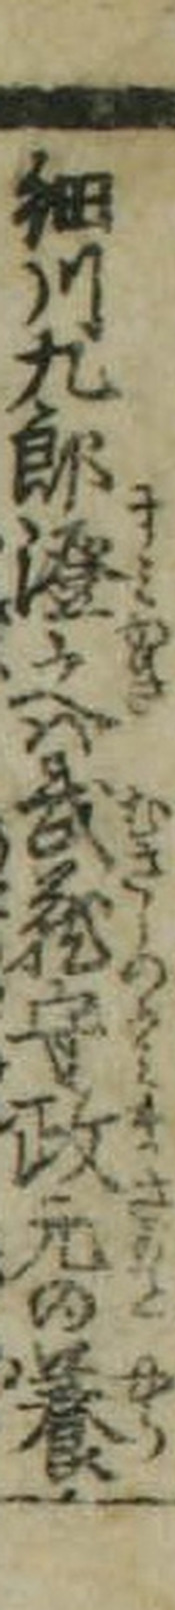細川九郎澄之は武蔵守政元の養
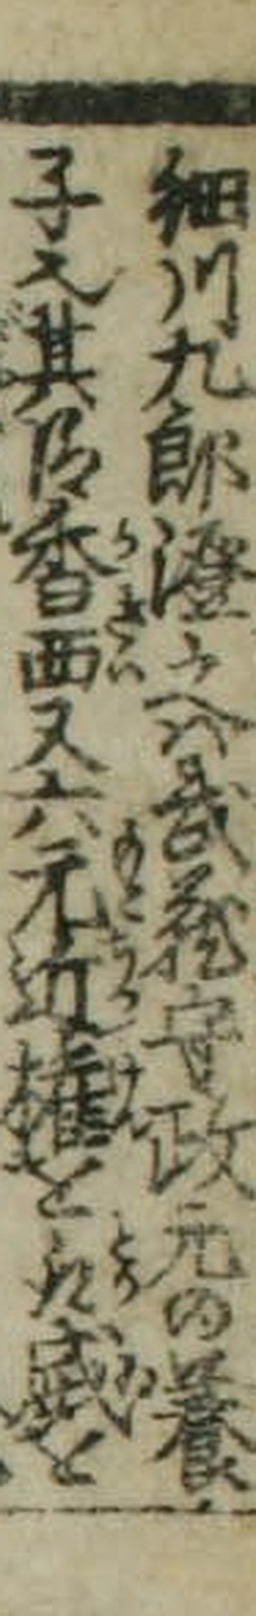子也其臣香西又六元近権を取威を
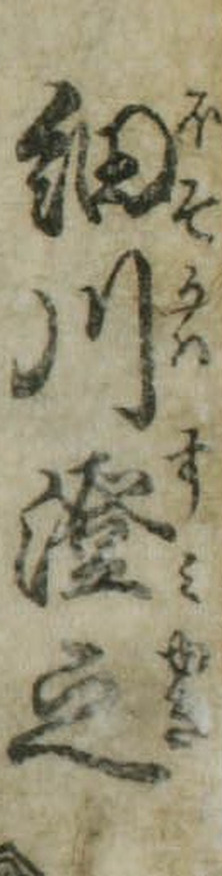細川澄之
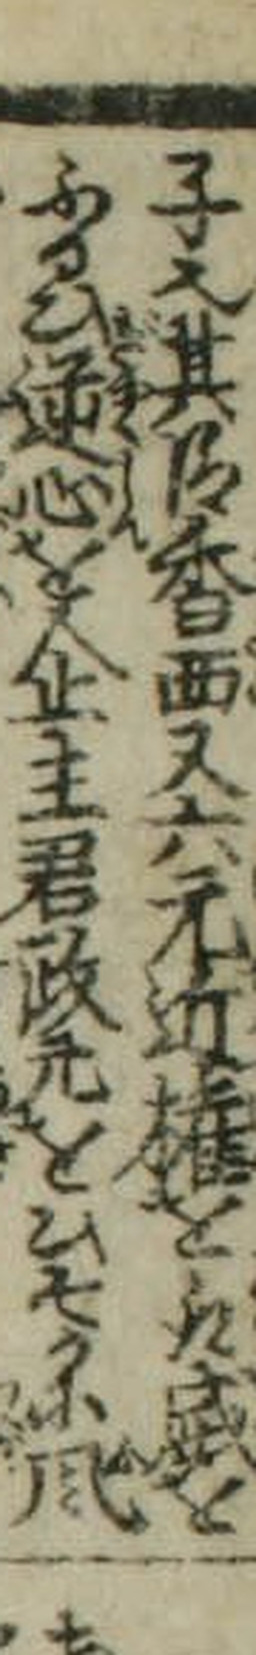ふるひ逆心を企主君政元をひそかし風
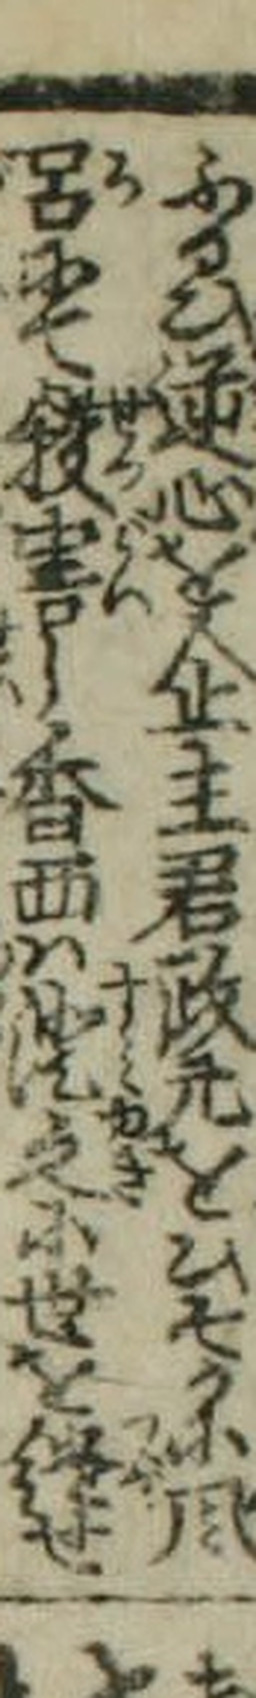呂にて殺害し香西は澄之に世を継せ
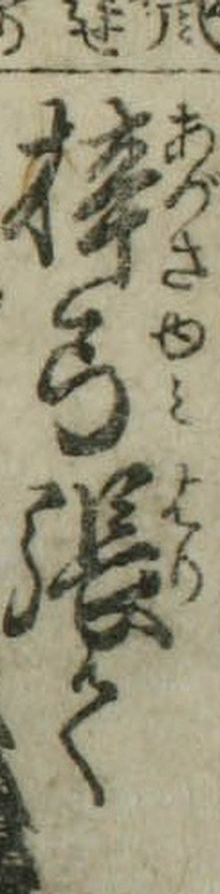梓弓張て
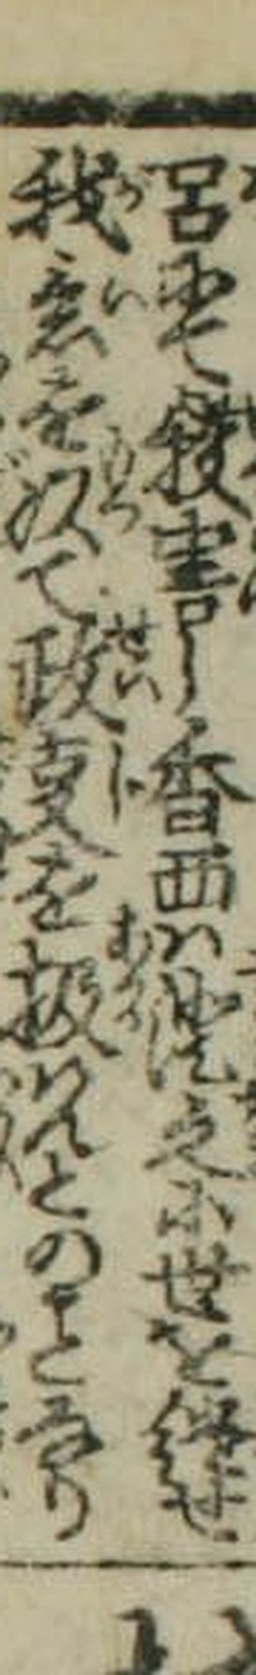我意を以て政事を扱はんとのことなり
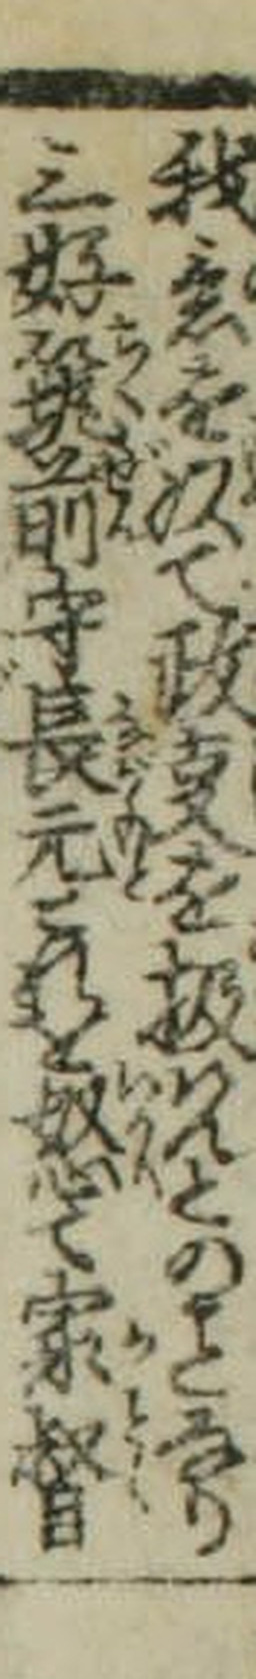三好筑前守長元これを怒て家督
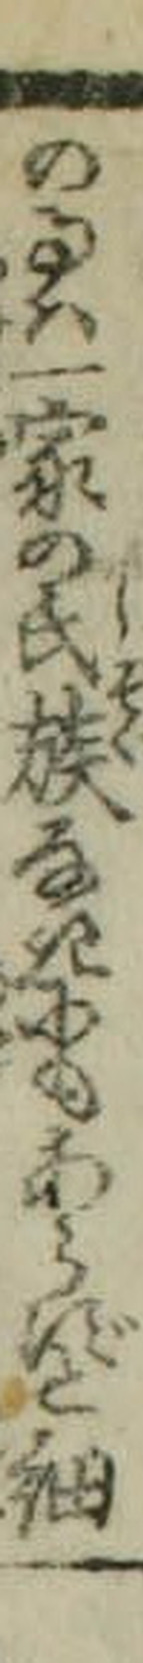の事は一家の氏族なきにもあらずと細
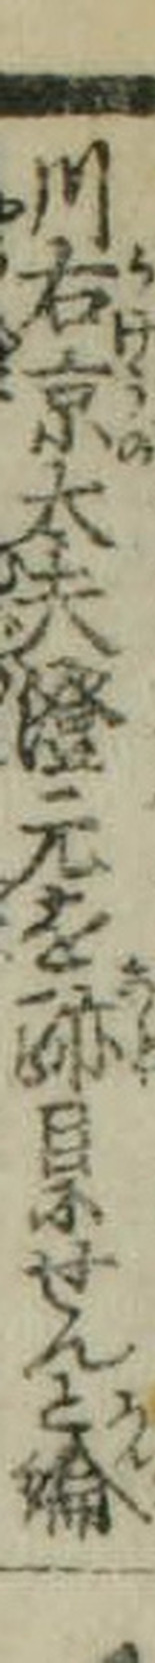川右京大夫澄元を跡目にせんと論
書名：續英雄百人一首
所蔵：東京学芸大学附属図書館
